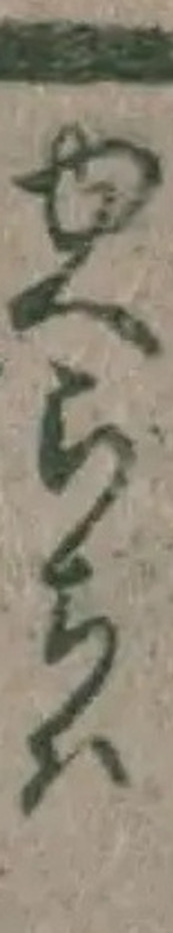ゆへらちは
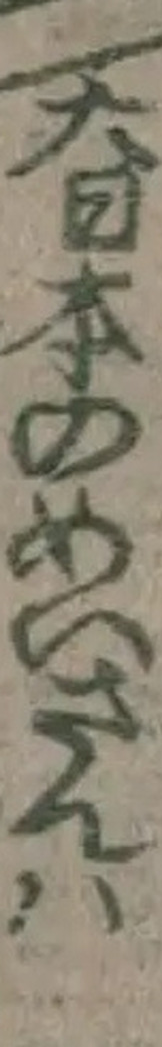大日本のめいさんは
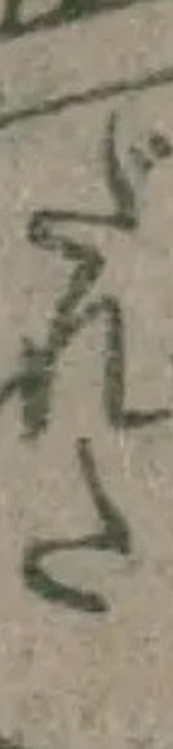だれた
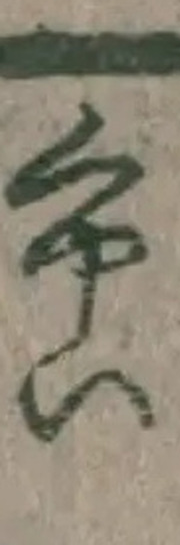くやしい

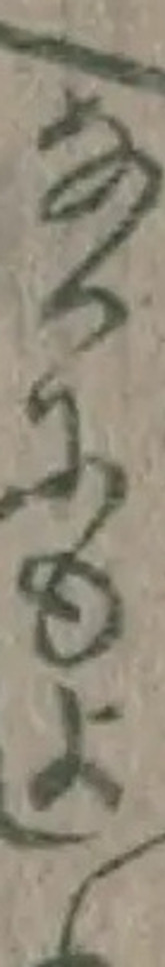なかにもよし
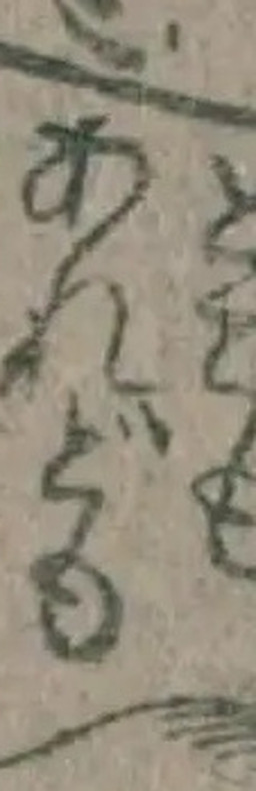あれども
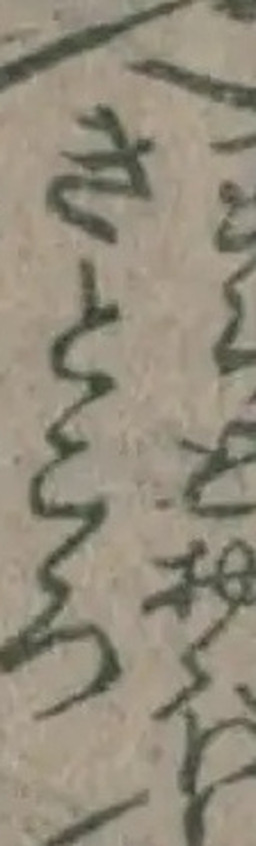きところ
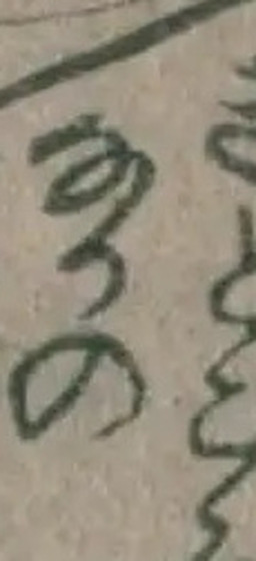なかの
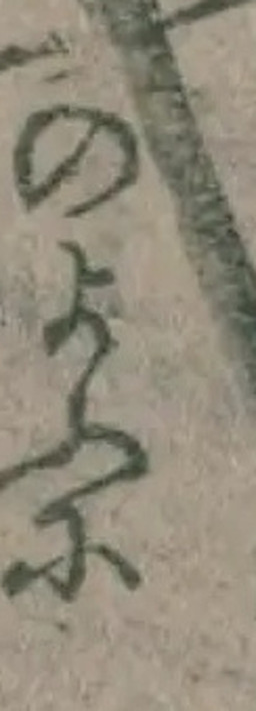のよふに
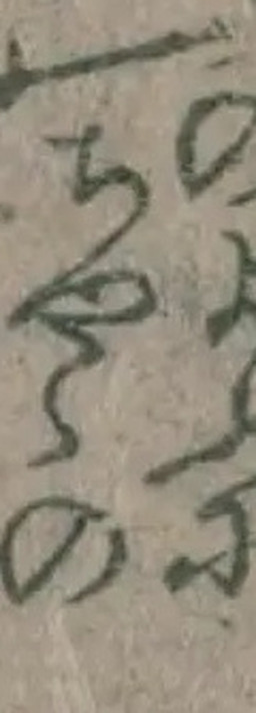ちやゝの
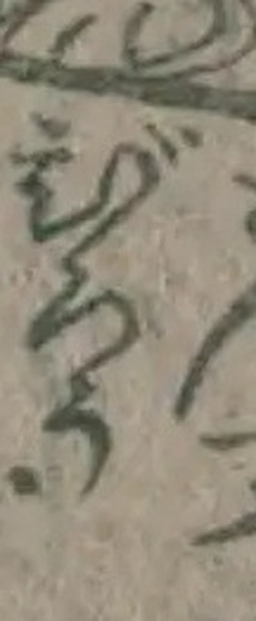びろう
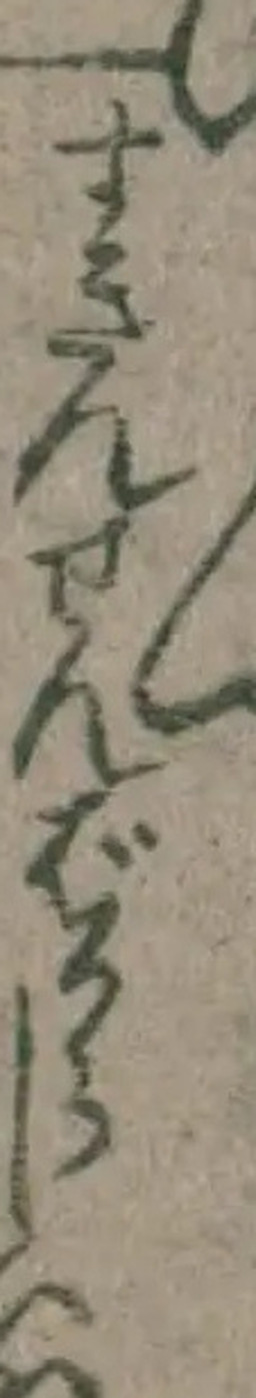すきんせんばからしいは
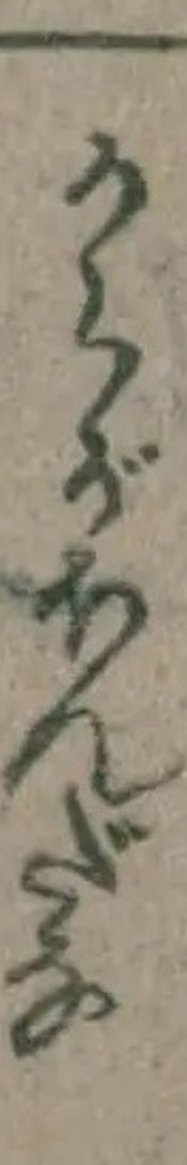からがほんだなか
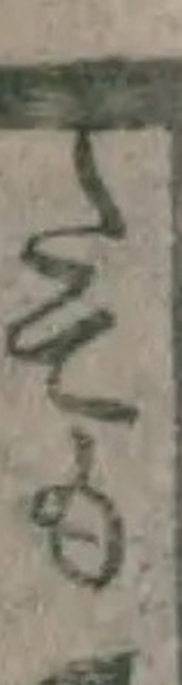たても
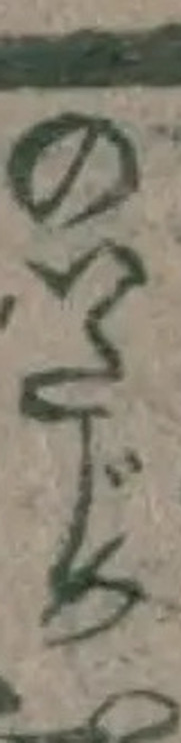のいたじめ
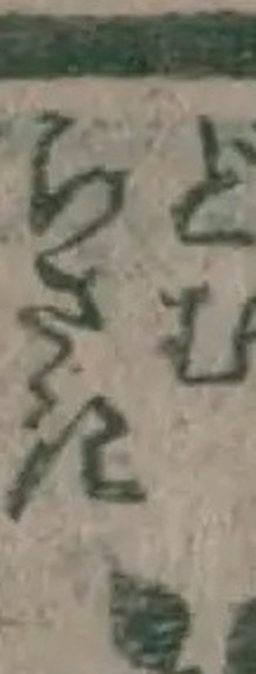らさき
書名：縦筒放唐の噺 3巻
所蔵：国立国会図書館 National Diet Library, JAPAN
